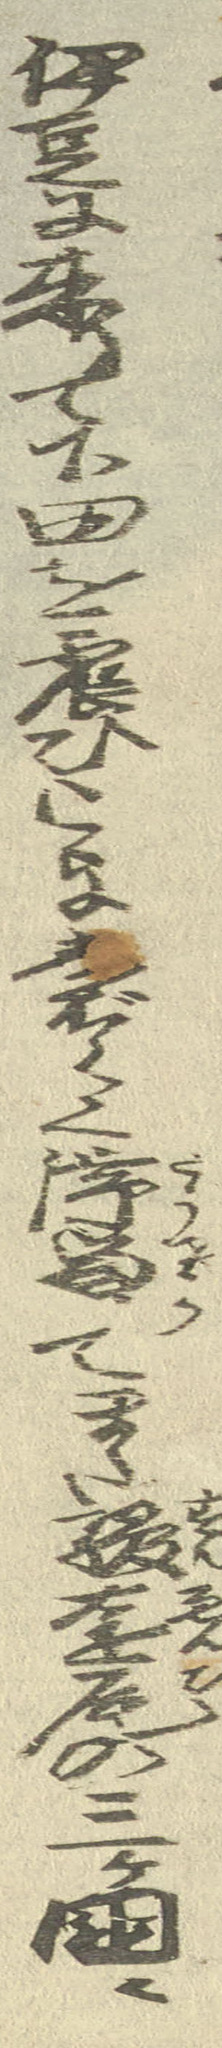伊豆に来りて下田を震ひこゝにしばらく滞留てまた駿遠尾の三ヶ国ニ
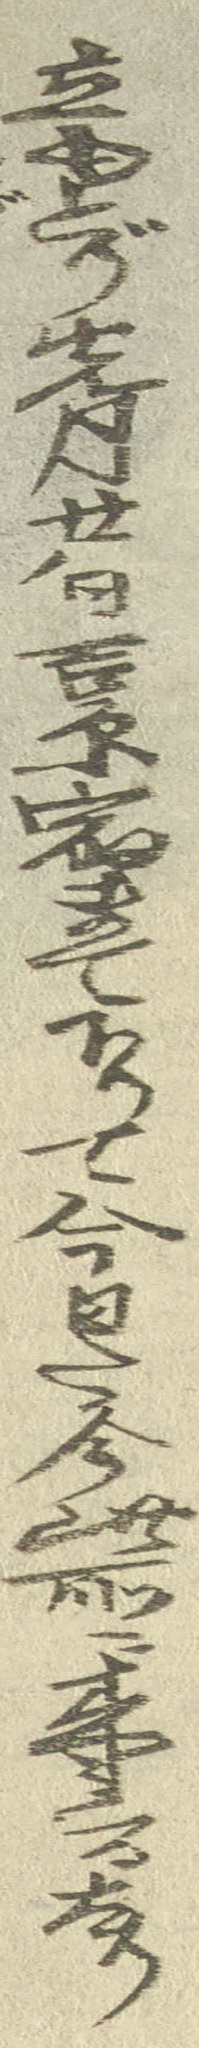立もどり先月廿ノ日吉原宿まて下りて今日たゝ今此所ニ来れるなり
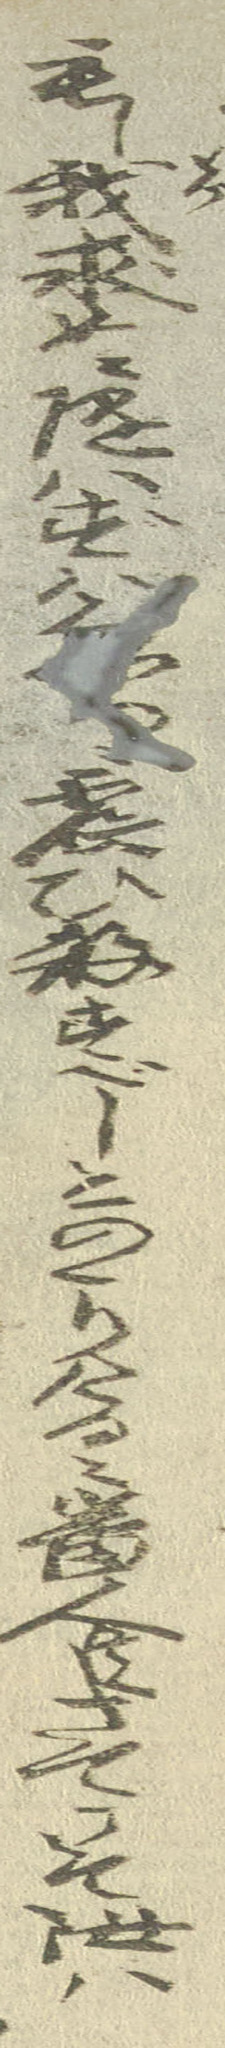もし我求めニ随ハずハ忽ちニ震ひ殺すべしとのゝりけるニ番人共さてこそ汝ハ
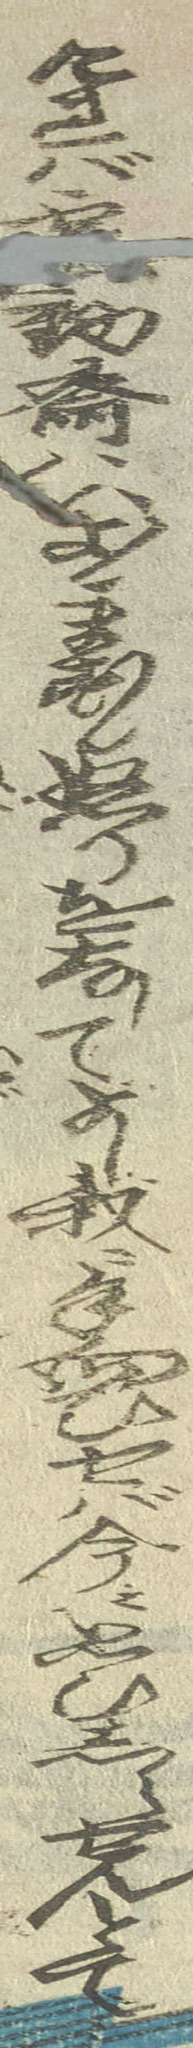けれバ震動斎ハいよ〳〵ます〳〵怒りをなしてよし我ニ手向ひせバ今ニ思ひしらせんとて
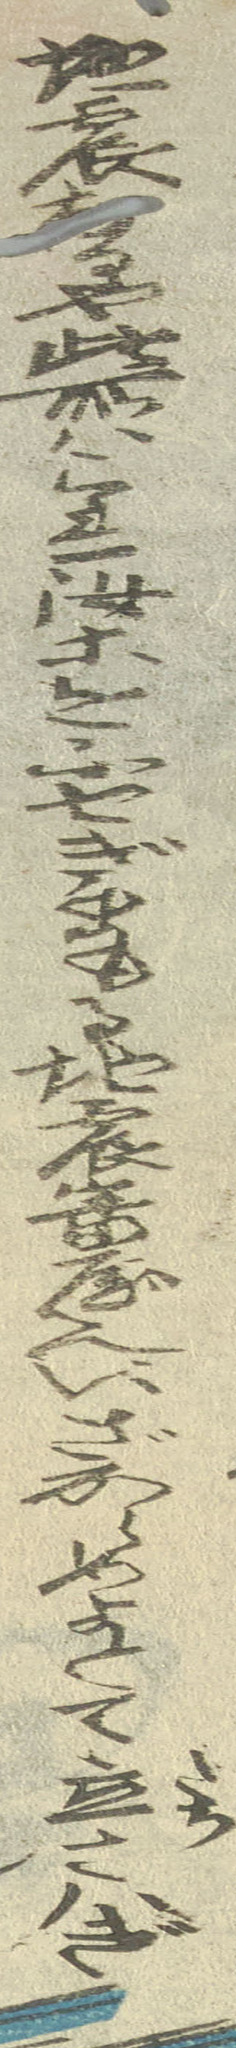地震なるや此所ハこれ汝等をふせぎまもる地震番屋也いざからめよとて立さハぎ
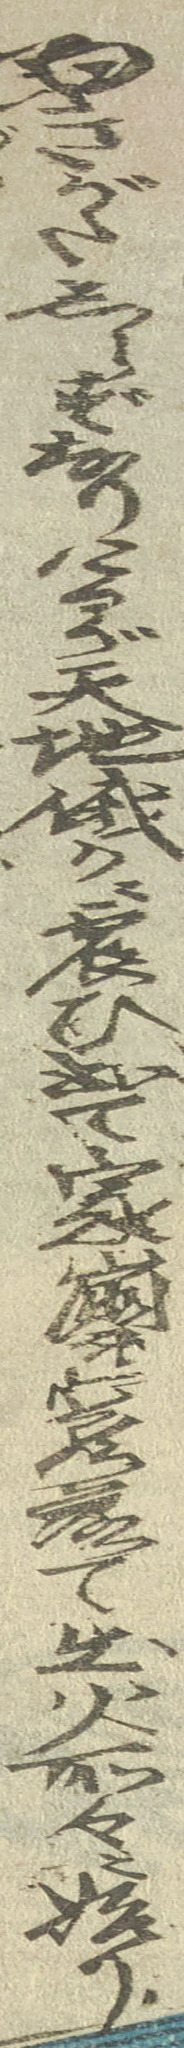ゆきがたしらずなりけるが天地俄かニ震ひ出て家崩れ蔵落て出火所々ニ始り
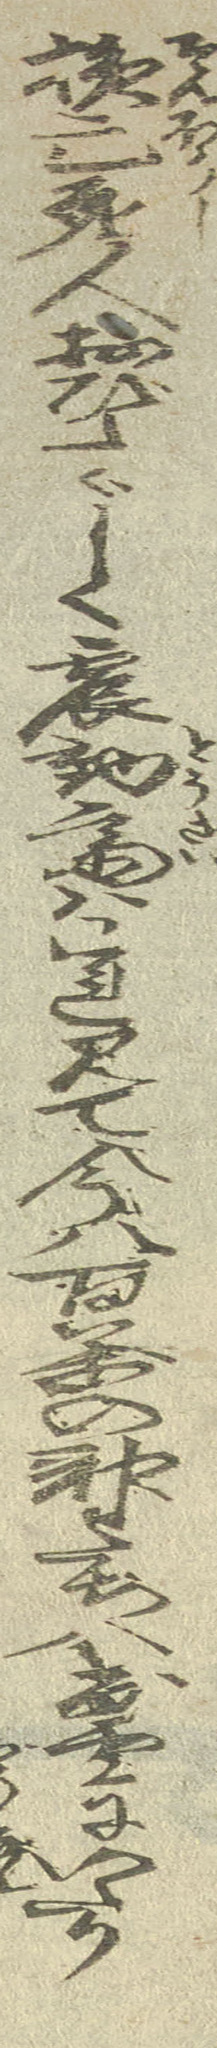損亡死人おびたゞしく震動斎ハこれ見て今八百万の神たちは出雲にいたり
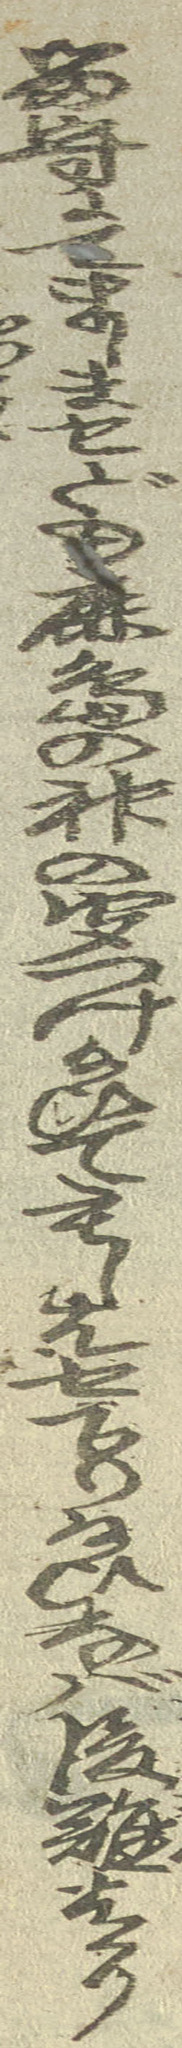留守にてましませども鹿島の神の聞つけ給ひてもしはせ下り給ひなバ後難はかり
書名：鯰之讎討
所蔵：東京大学総合図書館 General Library in the University of Tokyo, JAPAN
